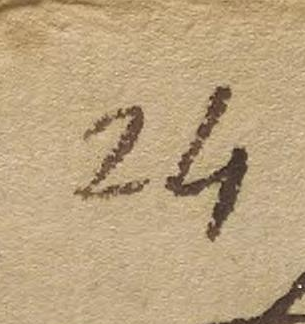24
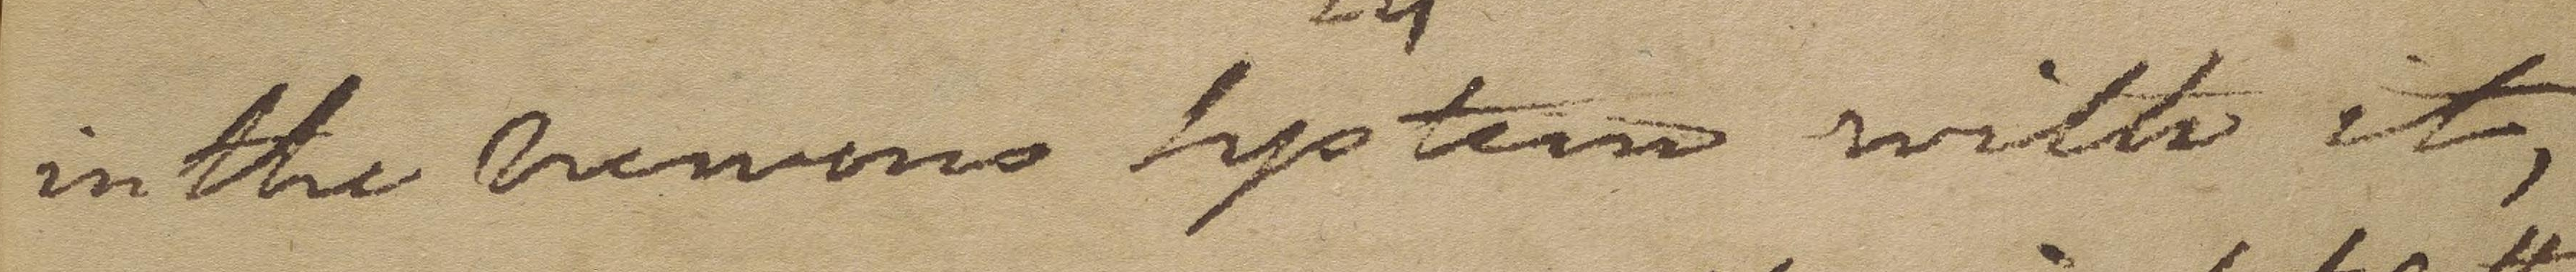in the nervous system with it,
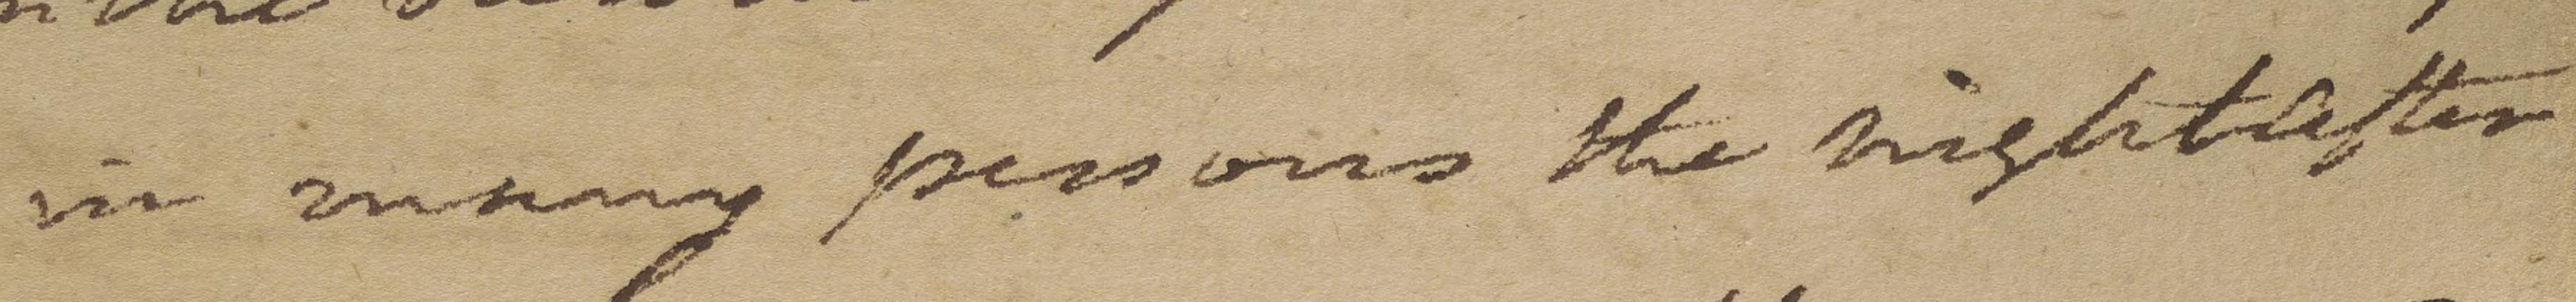in many persons in the night after
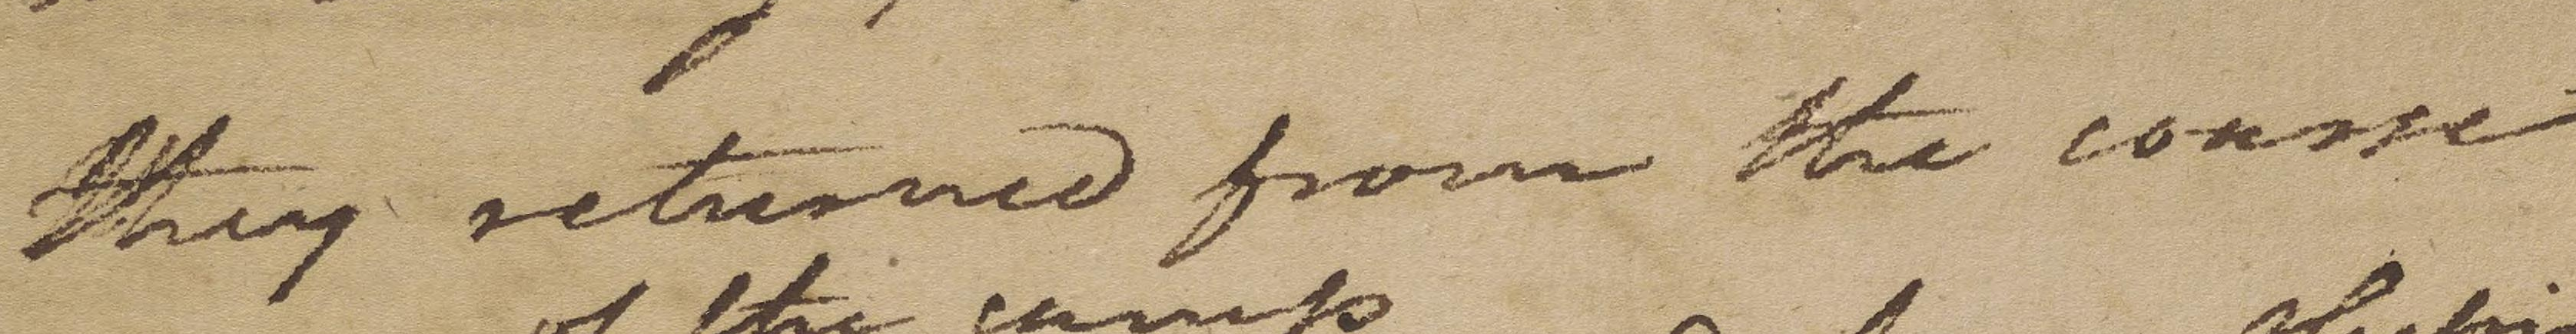they returned from the coarse
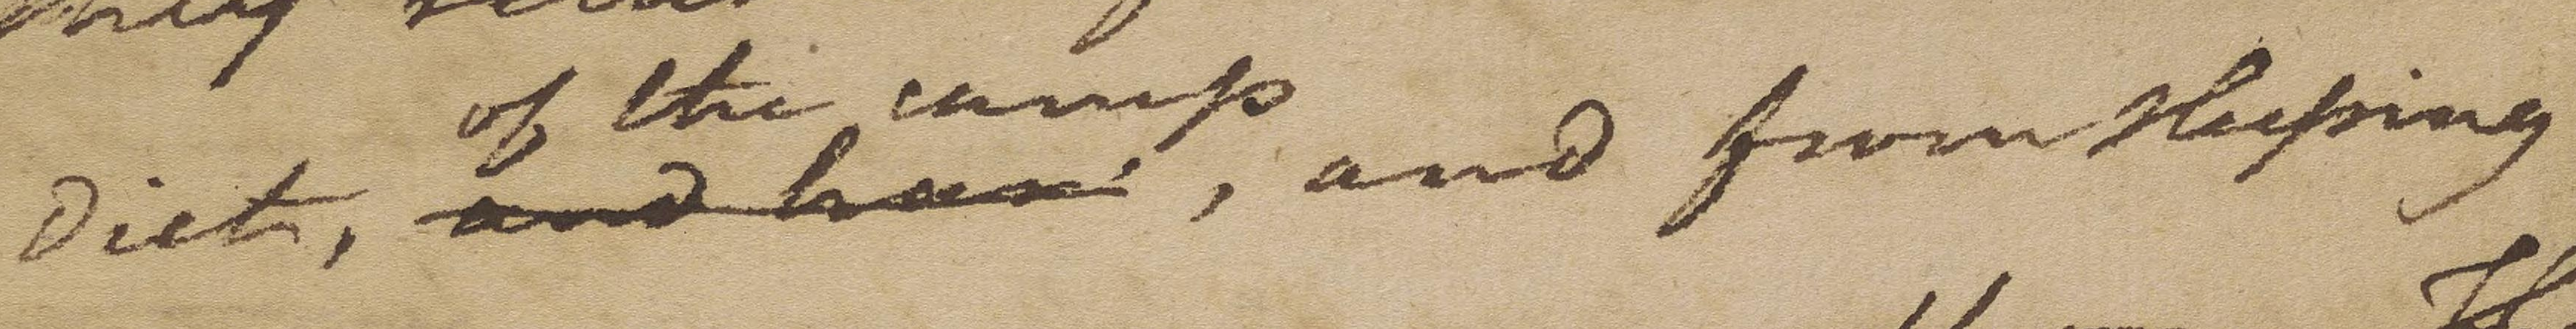diet, [and hav], and from sleeping
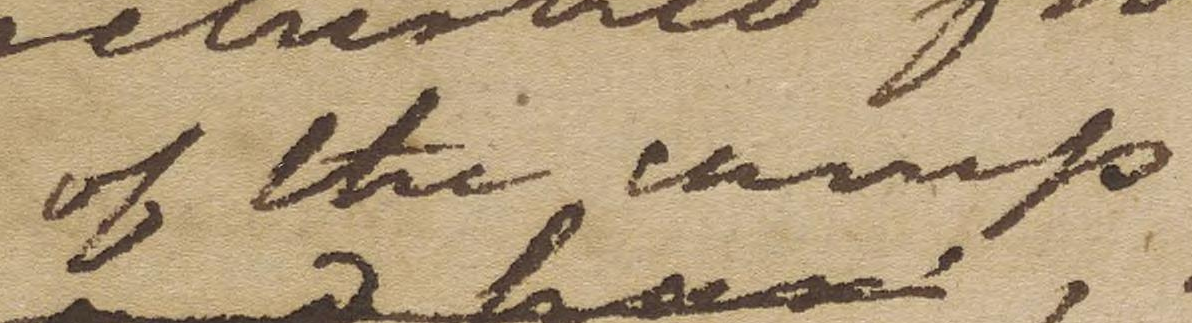of the camp
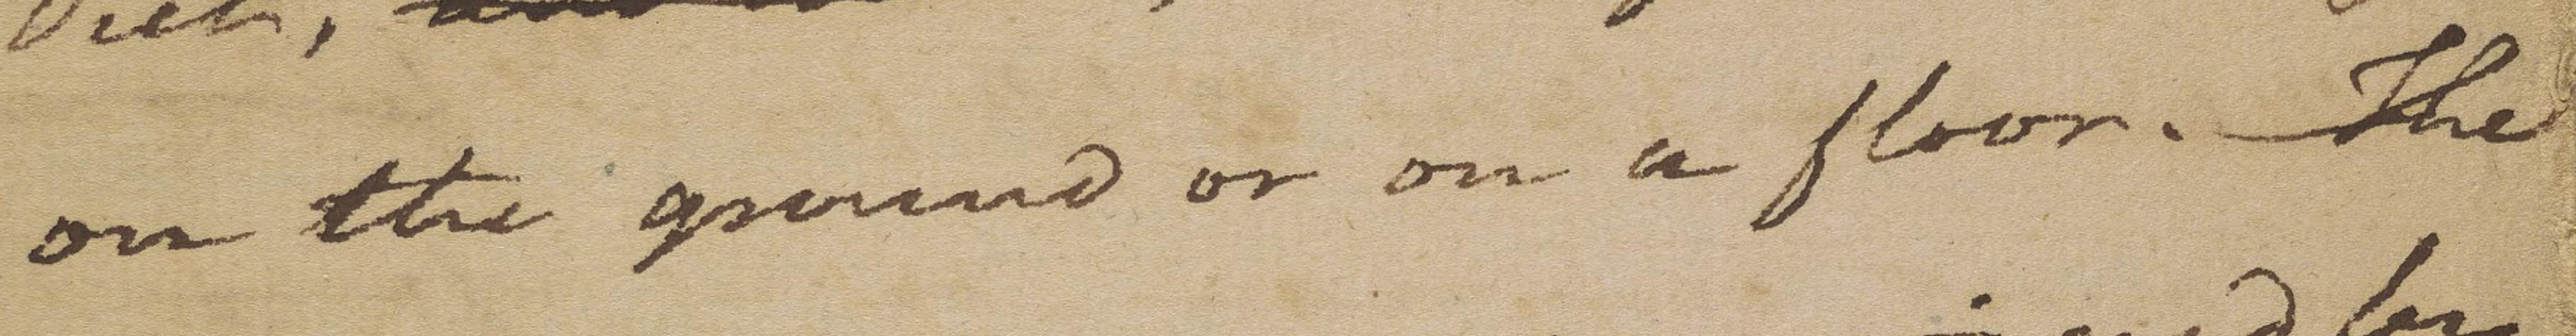on the ground or on a floor. The
